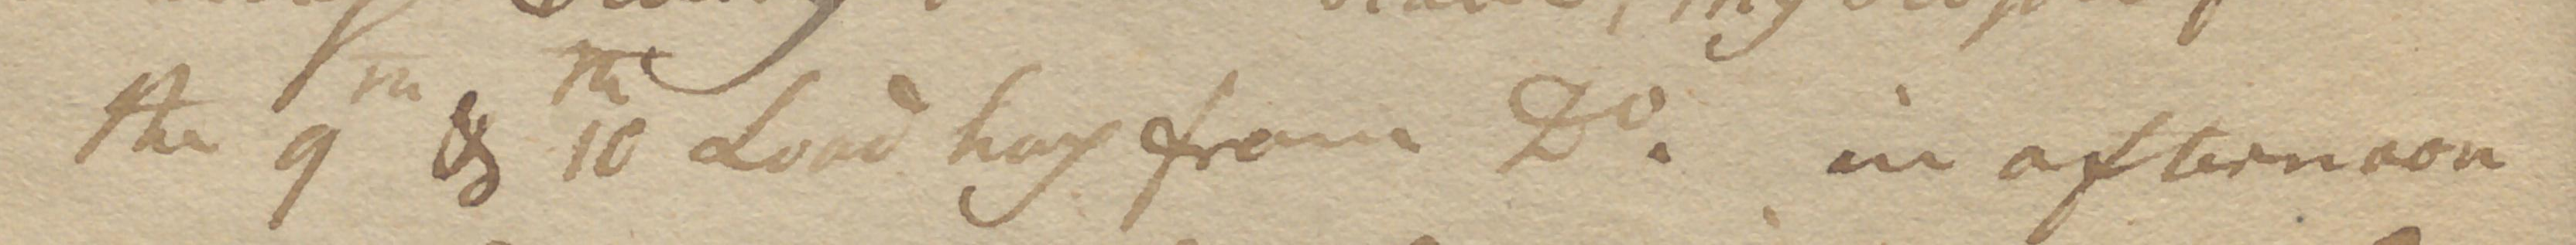the 9^th & 10^th Load hay from D^o. in afternoon
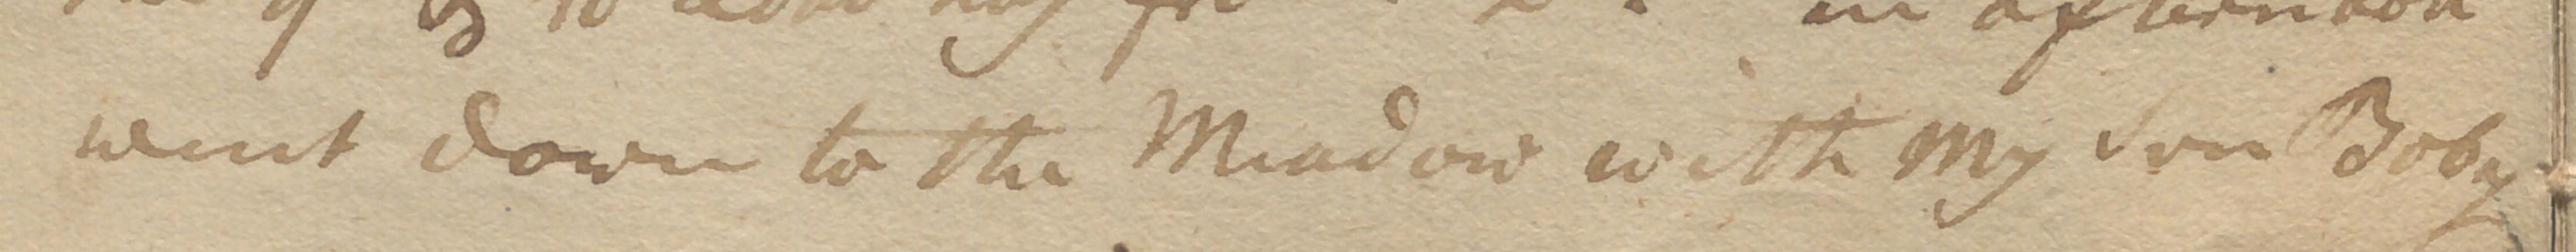went down to the Meadow with My son Boby
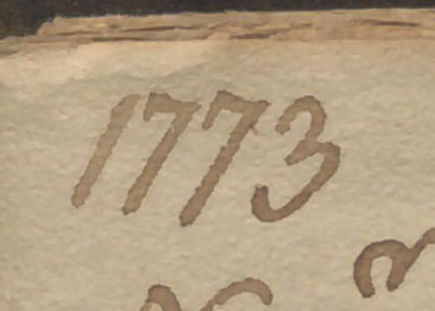1773
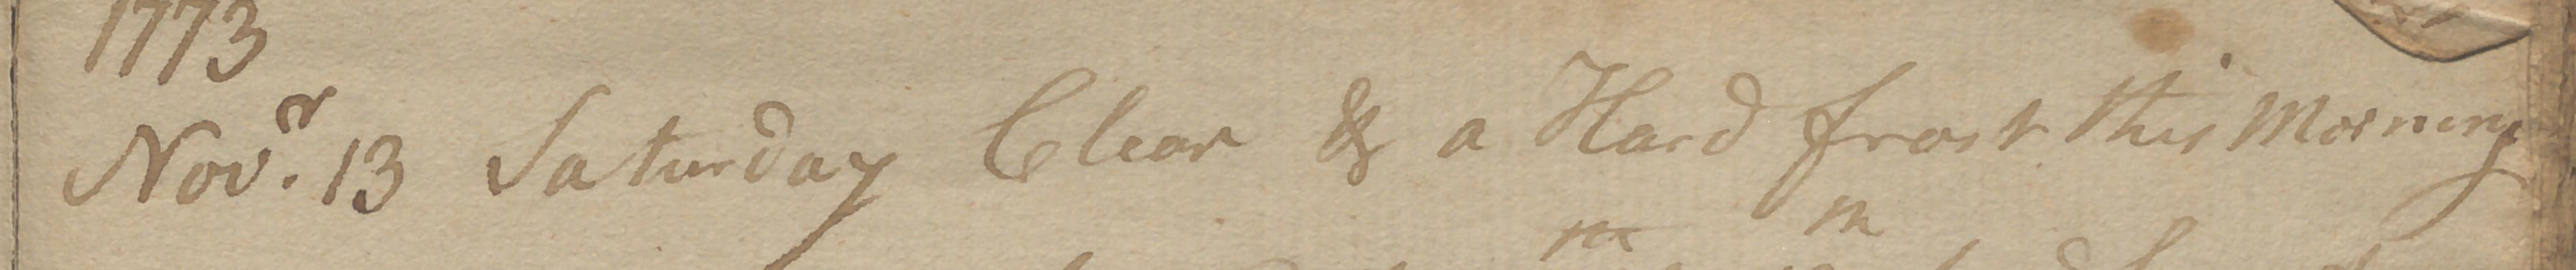Nov^r. 13 Saturday Clear & a Hard frost this Morning
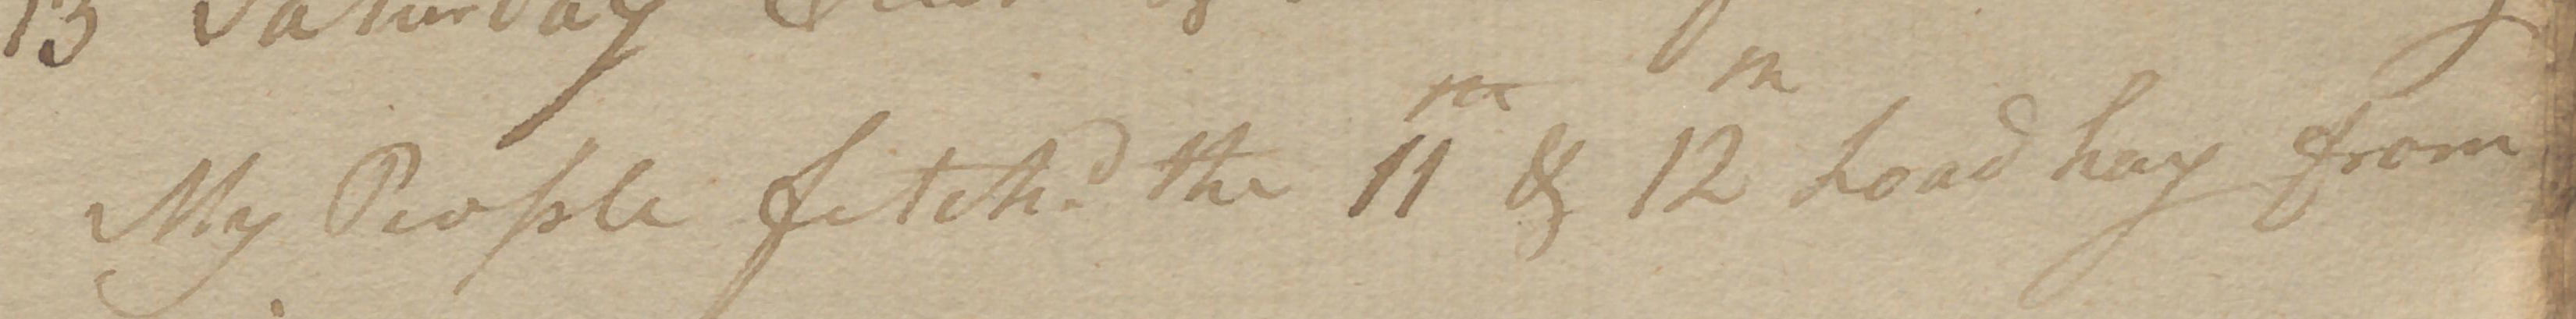My People fetch^d. the 11^th & 12^th Load hay from
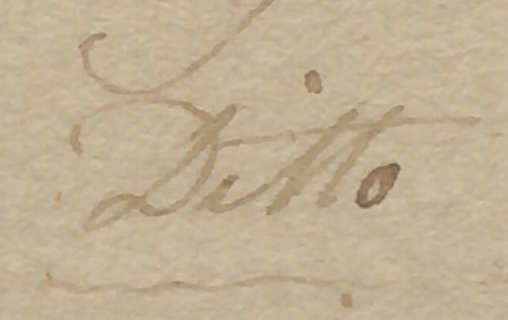Ditto
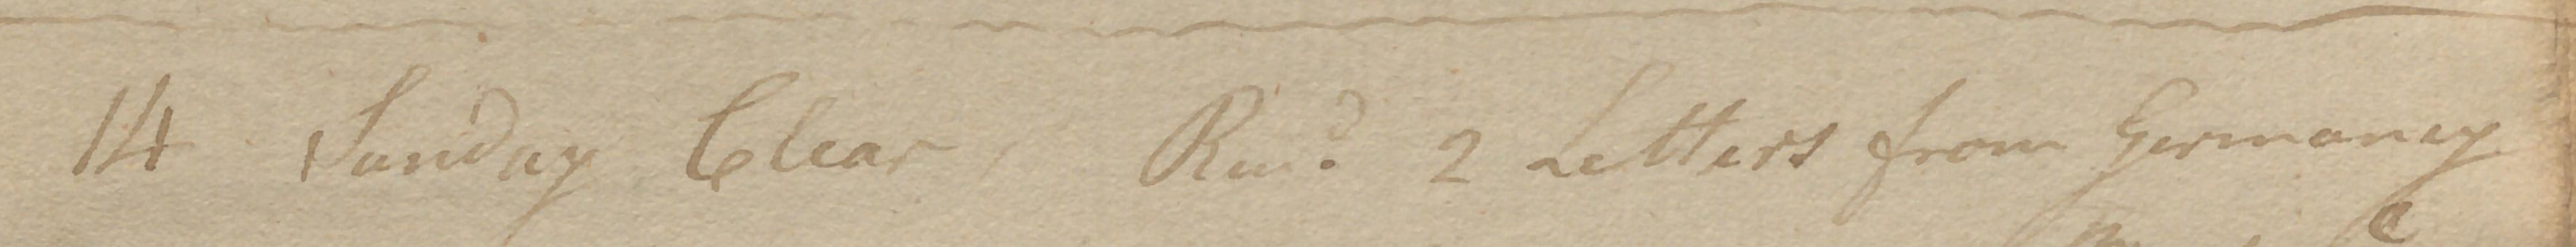14 Sunday Clear Rec^d. 2 Letters from Germaney
